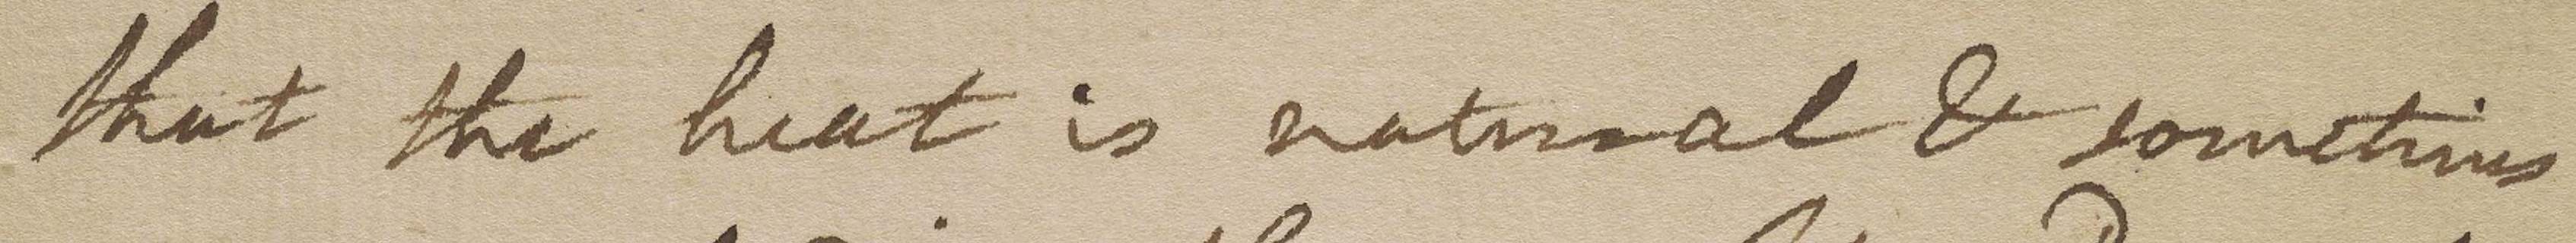that the heat is natural & sometimes
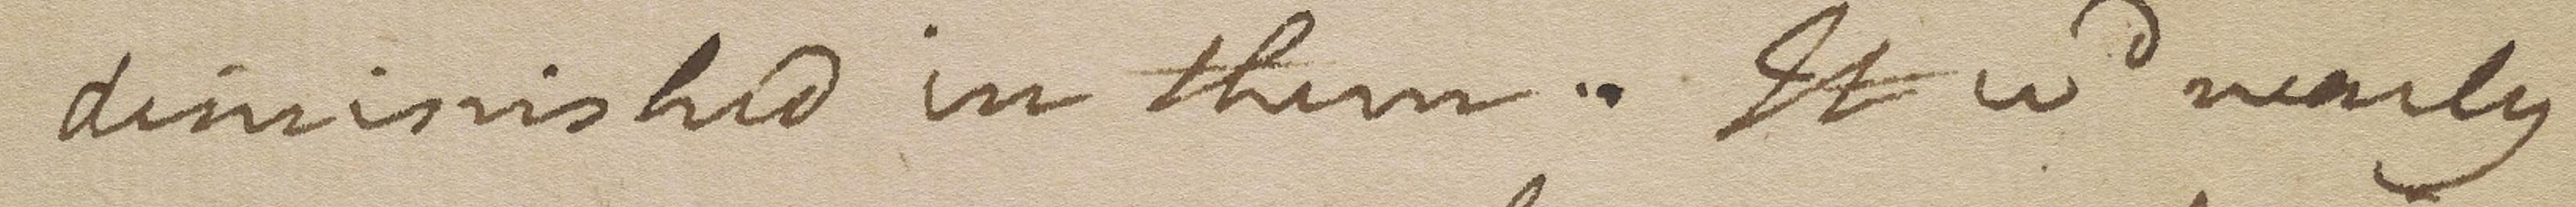diminished in them. It w^d nearly
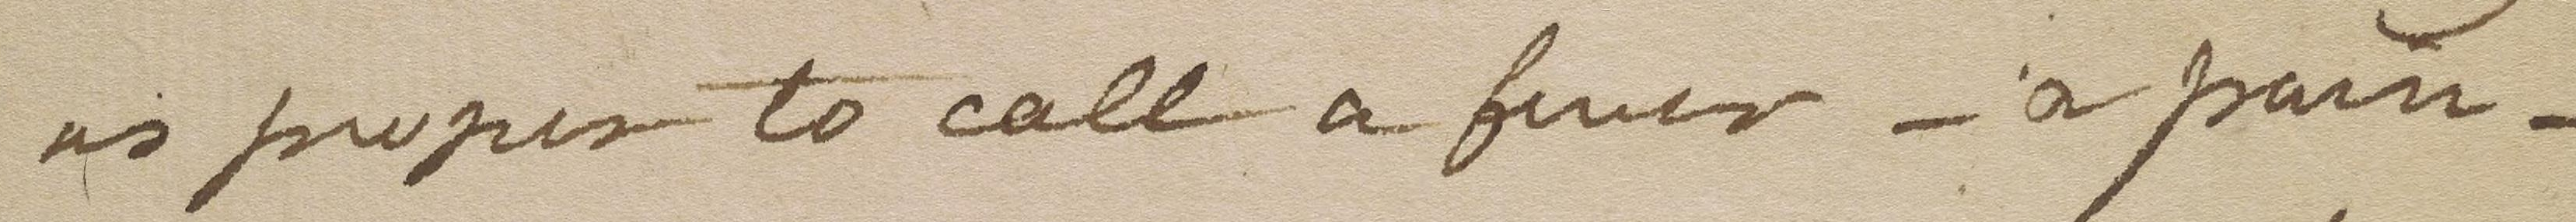as proper to call a fever- a pain-
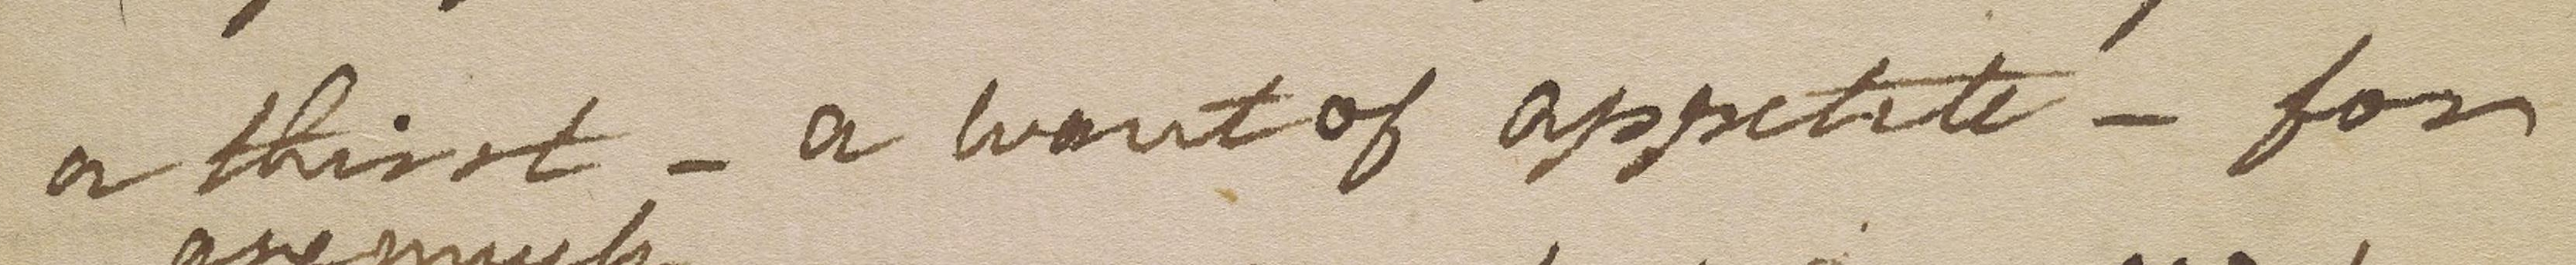a thirst- a want of appetite- for
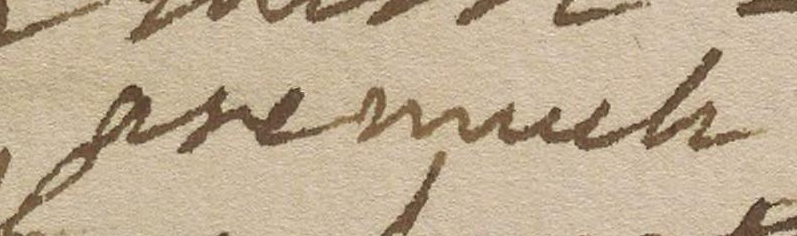are much
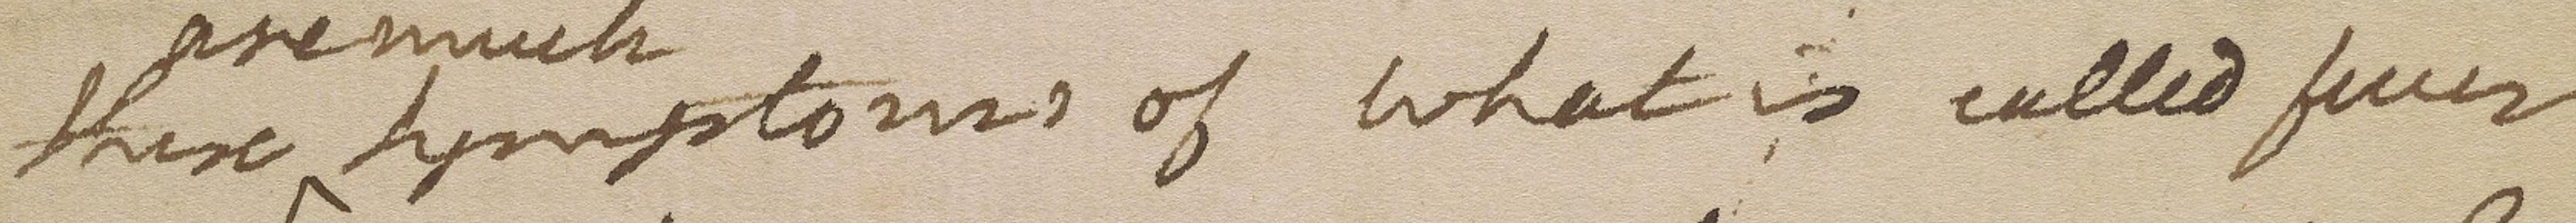there ^ symptoms of what is called fever
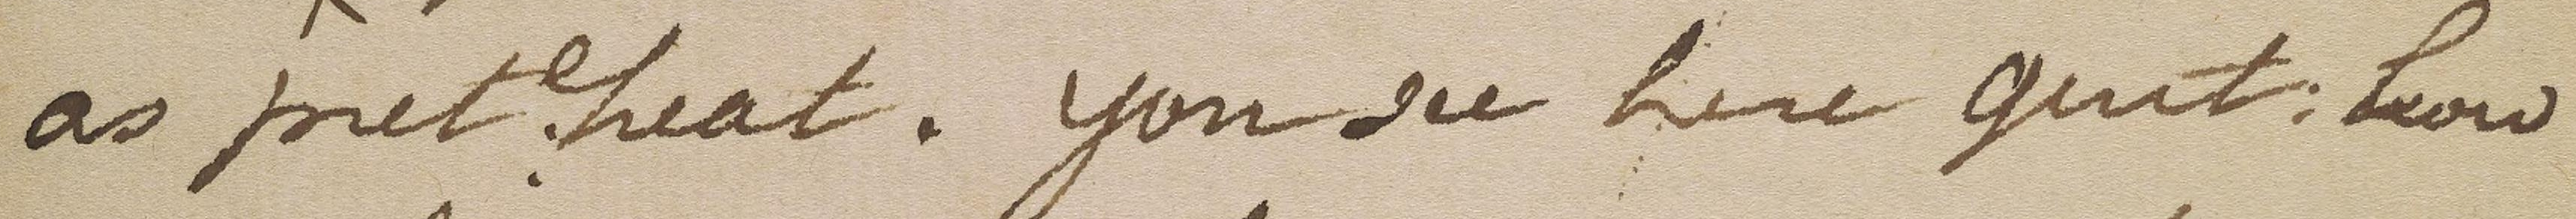as pret^e heat. You see here just how
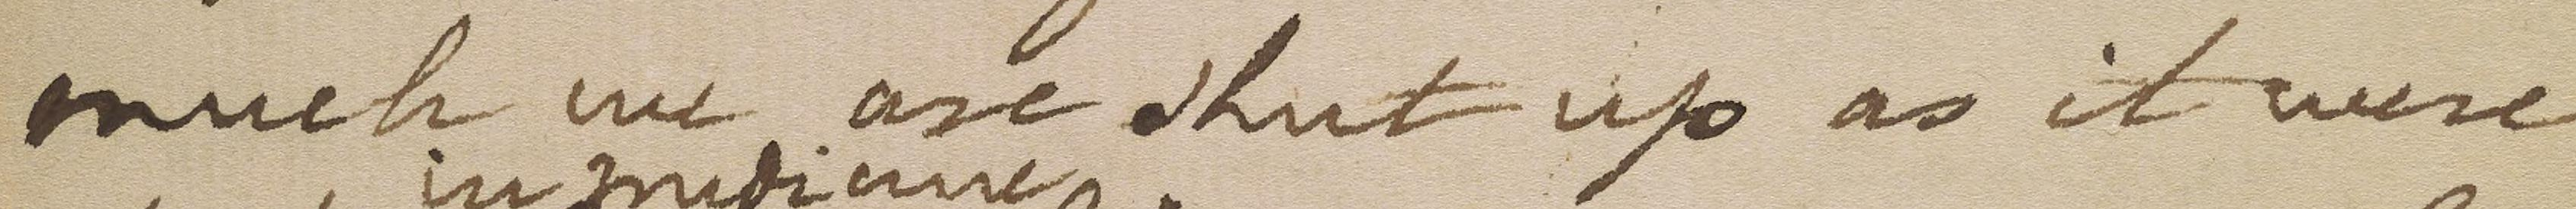much we are shut up as it were
